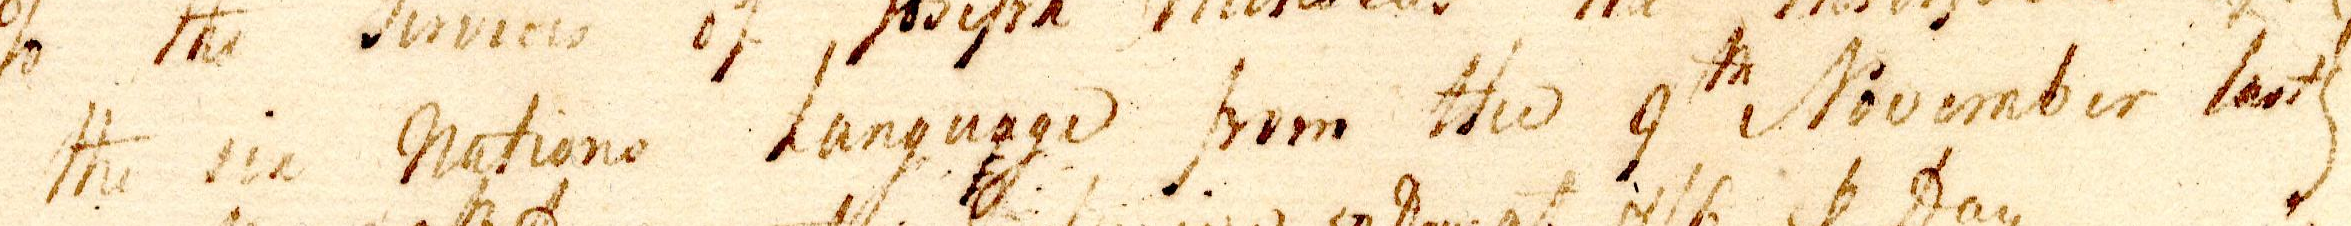the Six Nations Language from the 9^th November last
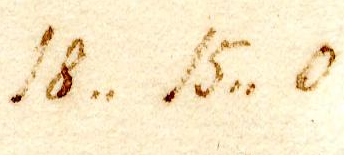18.. 15.. 0
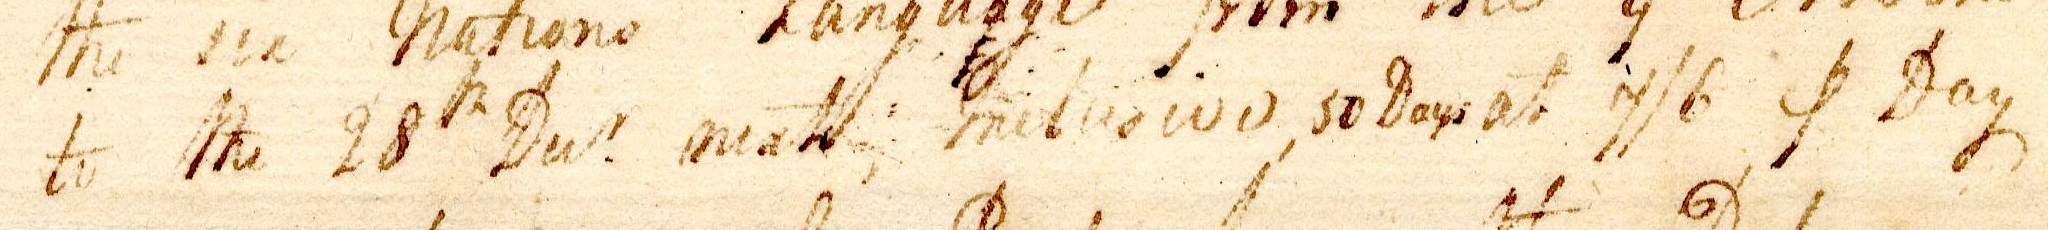to the 28^th Dec^r. neatly inclusive, 30 days at 7/6 per day
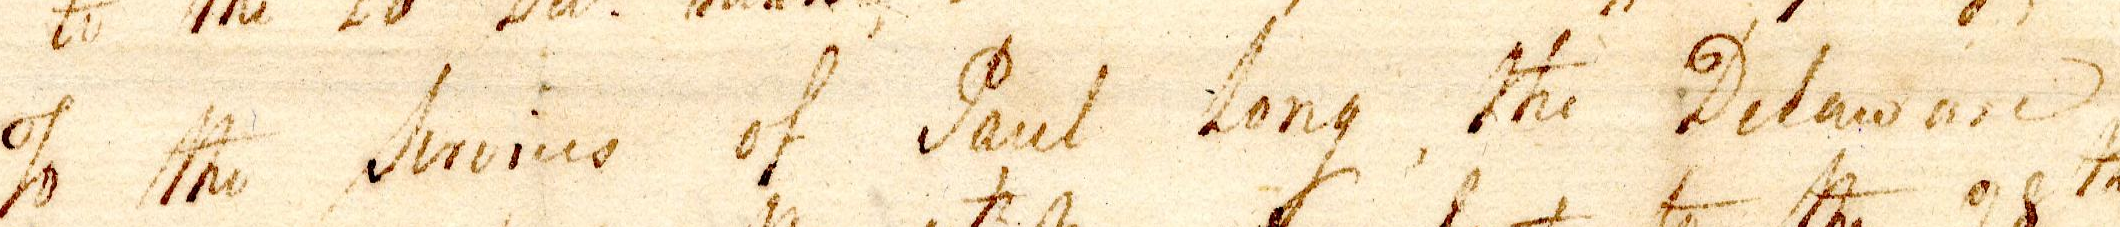To the Services of Paul Long the Delaware
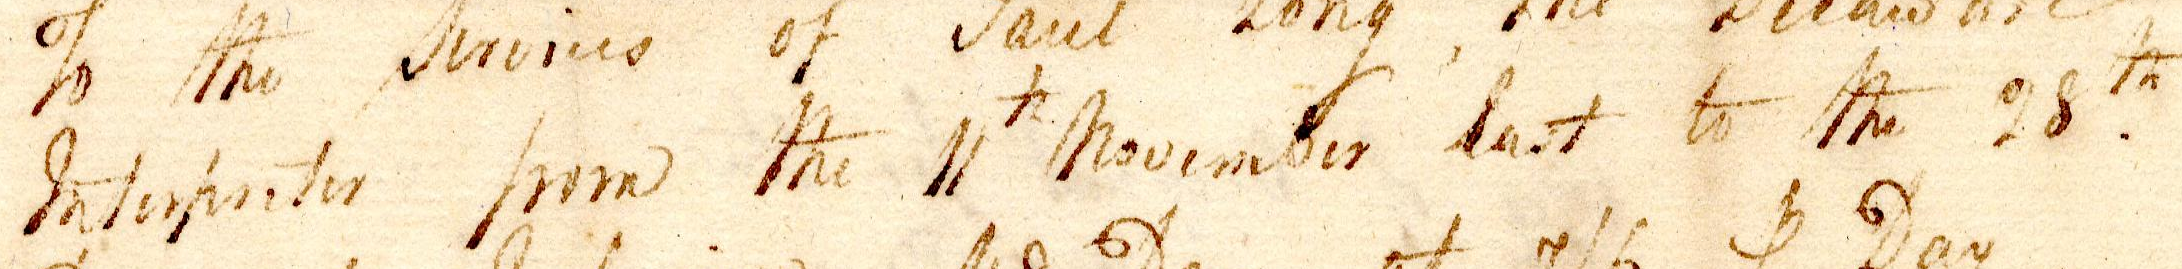Interpreter from the 11^th November last to the 28^th.
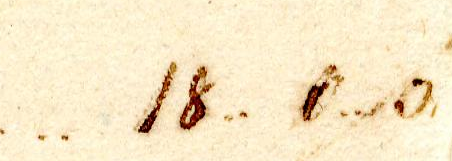18. 0. 0
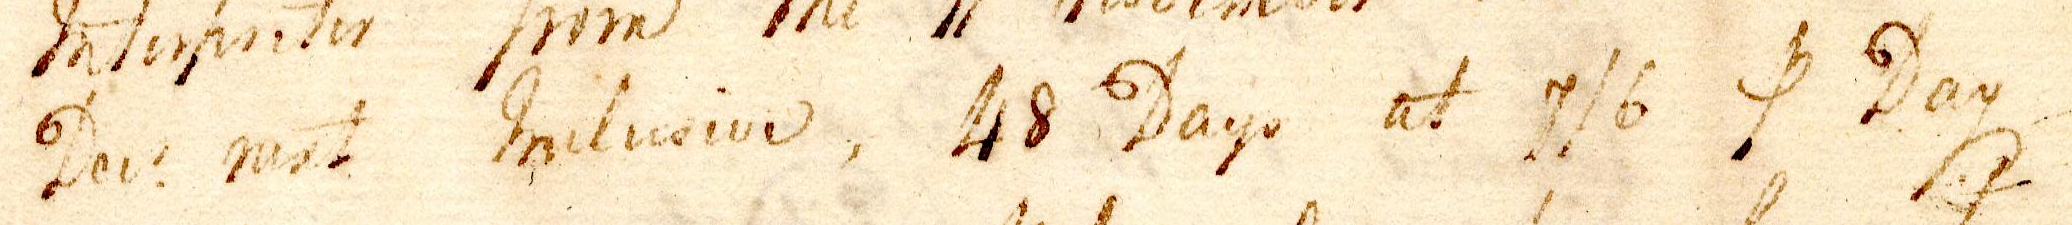Dec^r. next Inclusive, 48 Days at 7/6 per Day
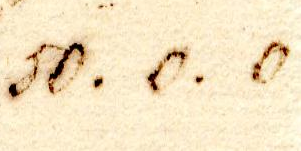50. 0. 0
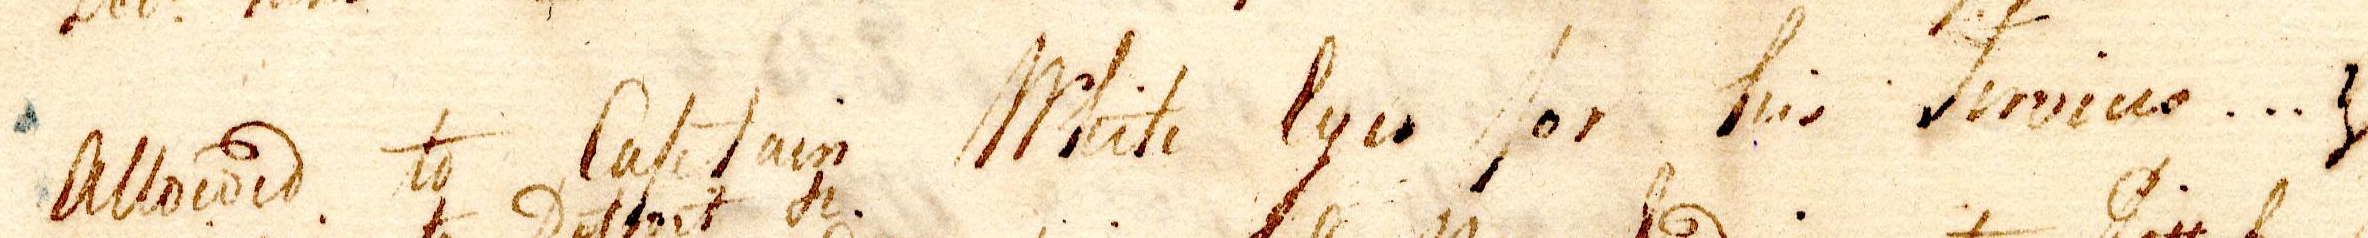Allowed to Captain White Eyes for his Services...
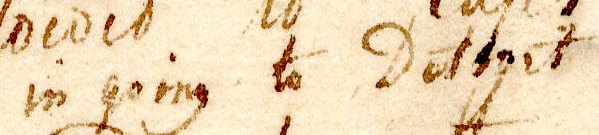in going to Detroit
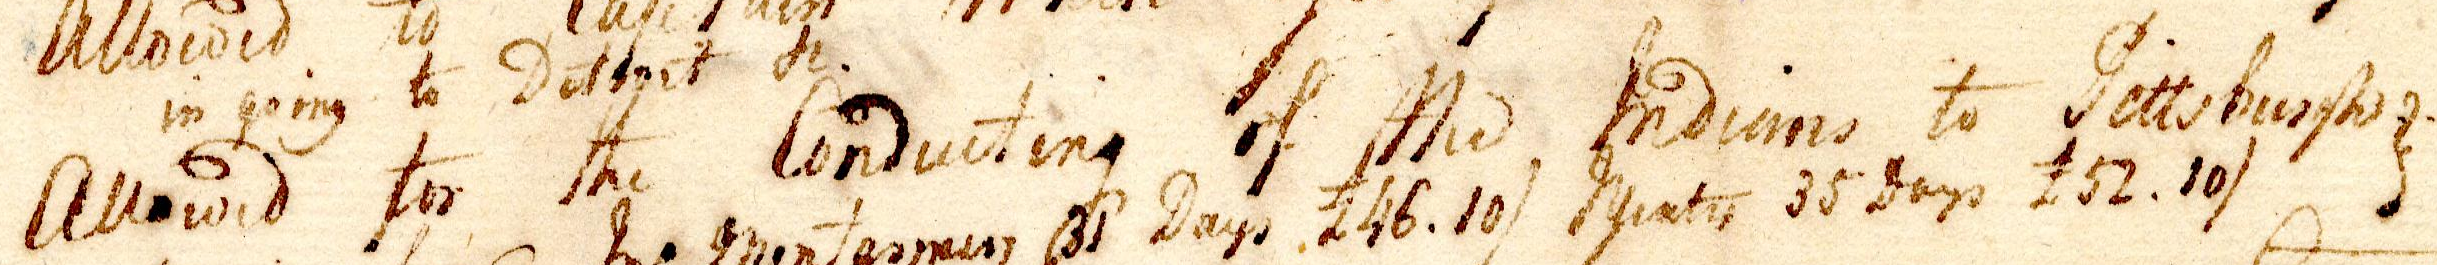Allowed for the Conducting of the Indians to Pittsburgh
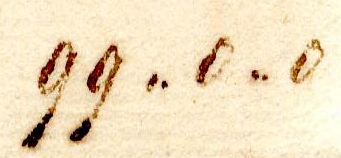99. 0. 0
